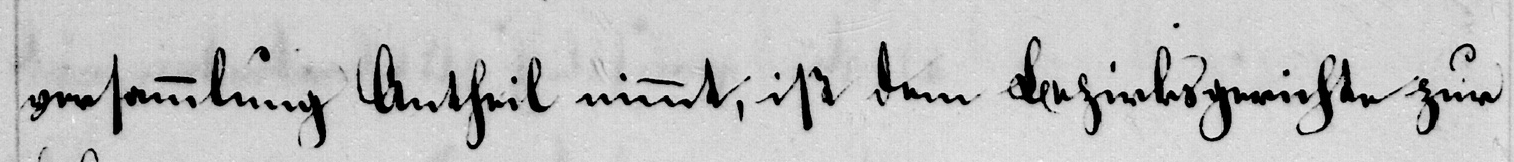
versammlung Antheil nimmt, ist dem Bezirksgerichte zur
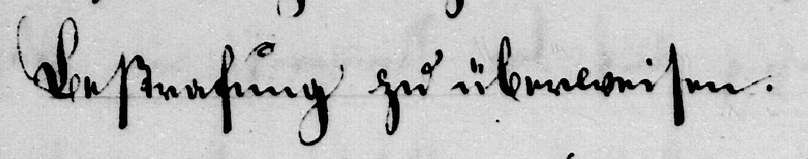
Bestrafung zu überweisen.
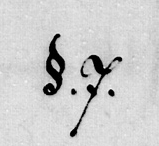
§.7.
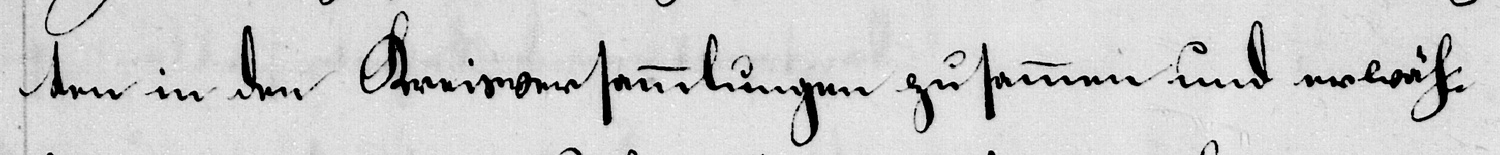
ten in den Kreisversammlungen zusammen und erwäh¬
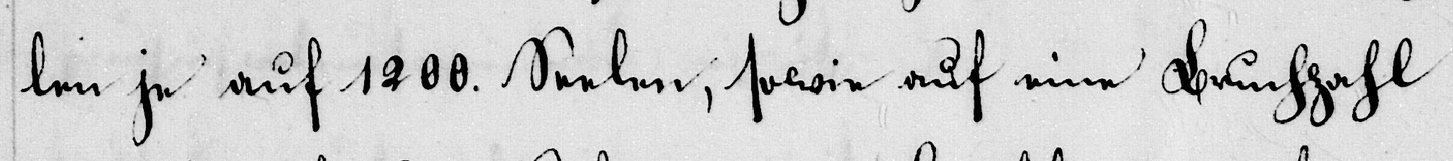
len je auf 1200. Seelen, sowie auf eine Bruchzahl
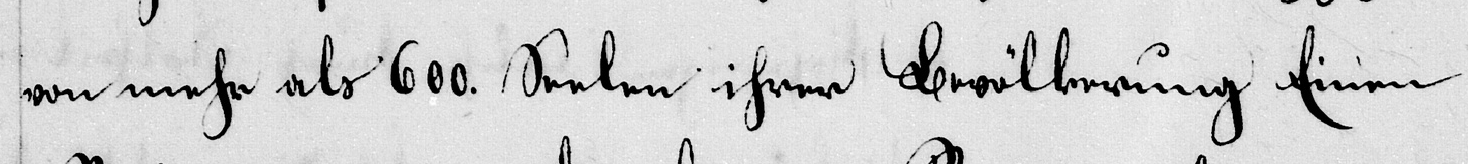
von mehr als 600. Seelen ihrer Bevölkerung Einen
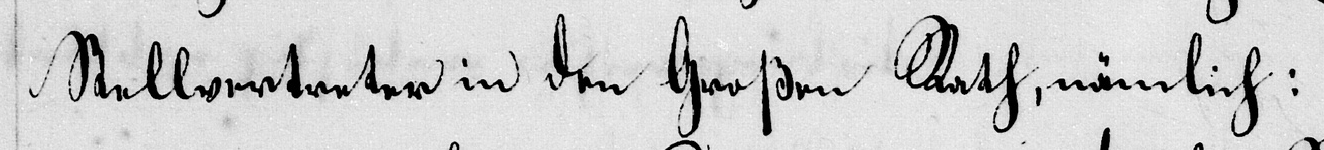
Stellvertreter in den Großen Rath, nämlich:
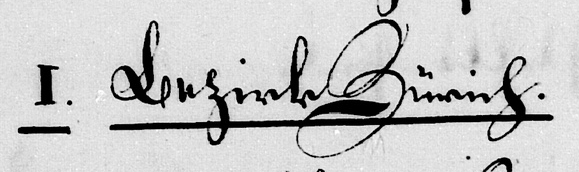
I. Bezirk Zürich
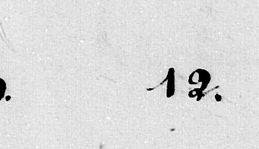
12.
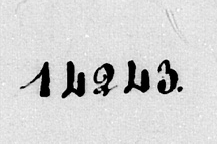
14243.
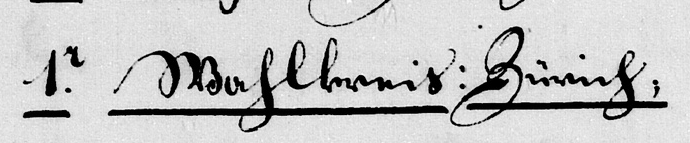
1.r Wahlkreis: Zürich
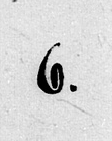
6.
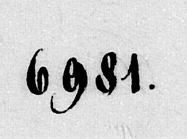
6981.
